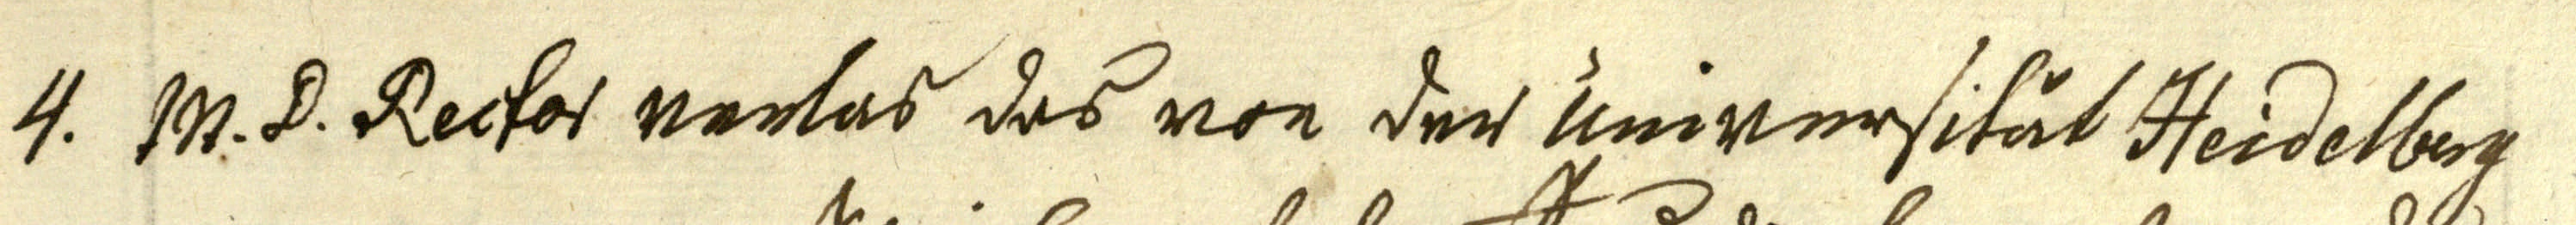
4. M. D. Rector verlas das von der Universität Heidelberg
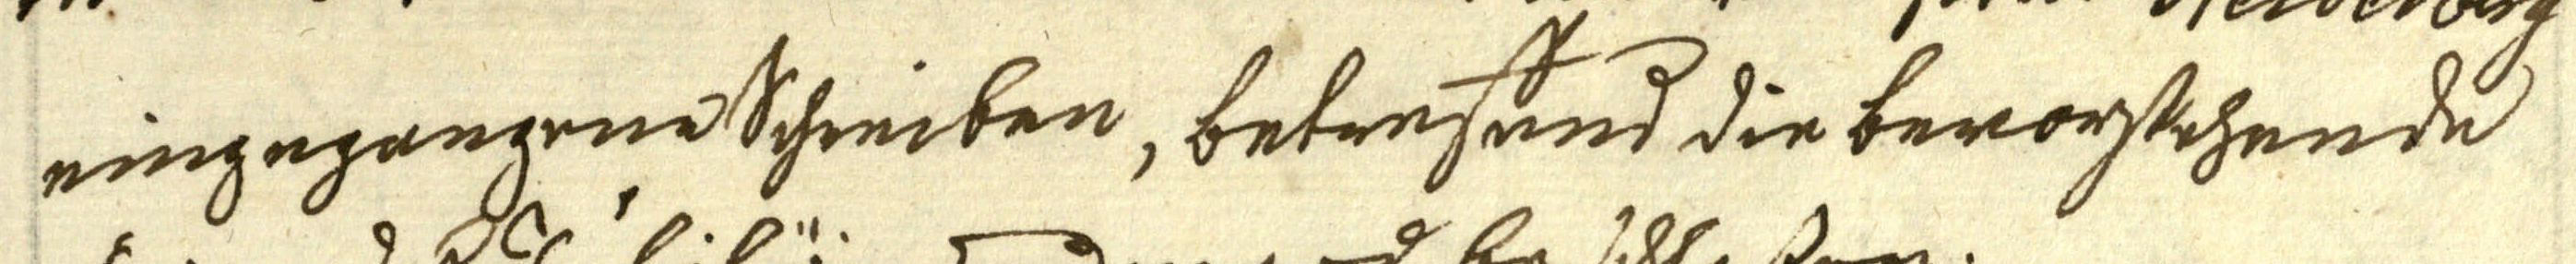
eingegangene Schreiben, betreffend die bevorstehende
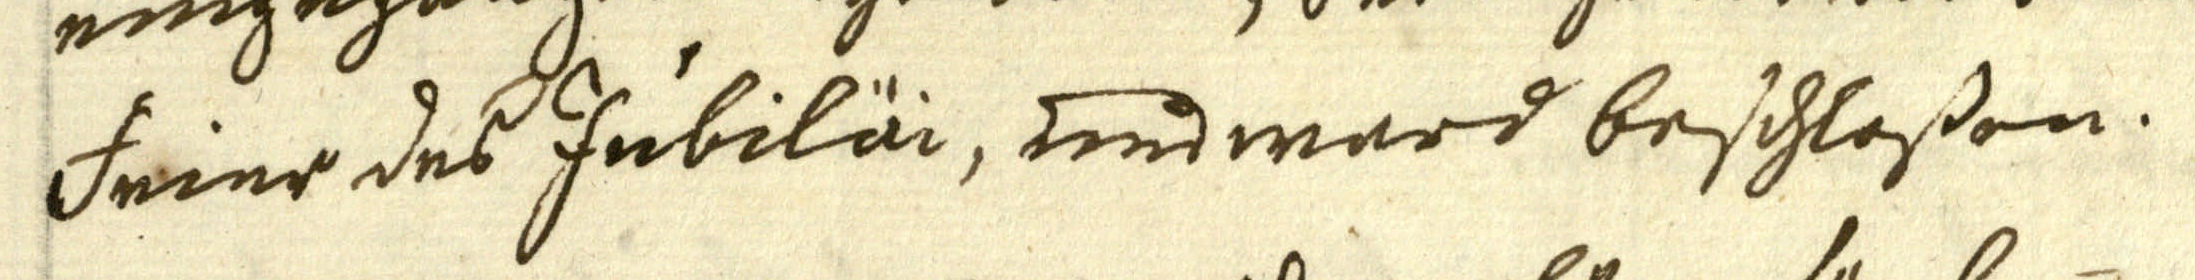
Feier des Jubiläi, und ward beschloßen,
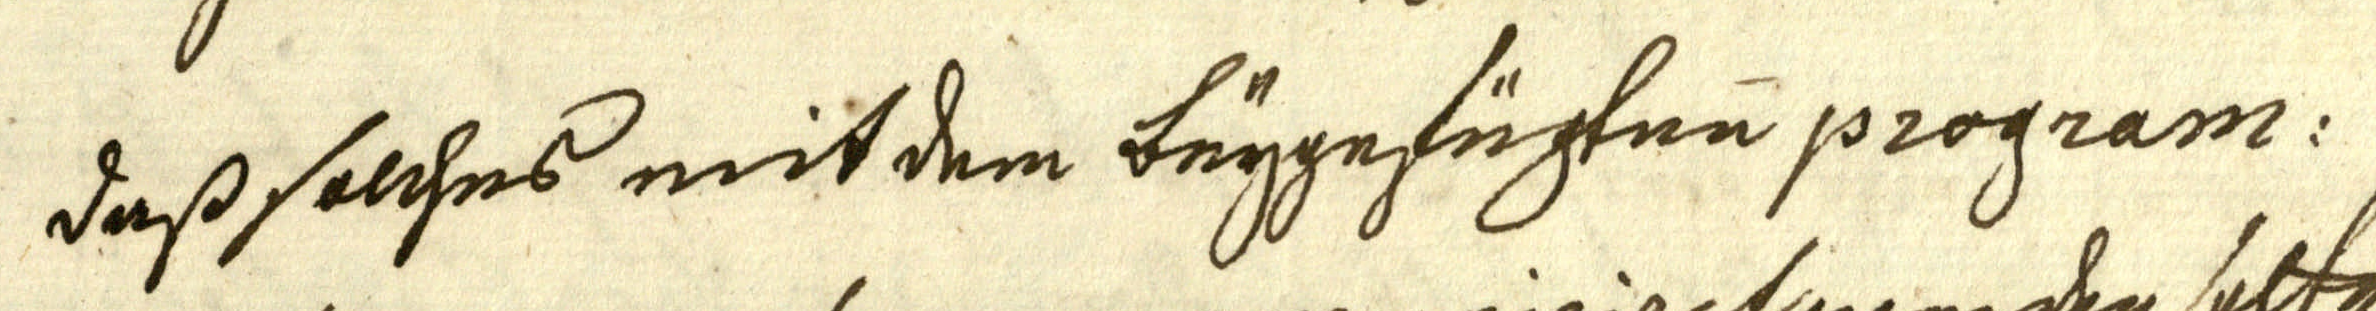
daß solches mit dem beÿgefügten program¬
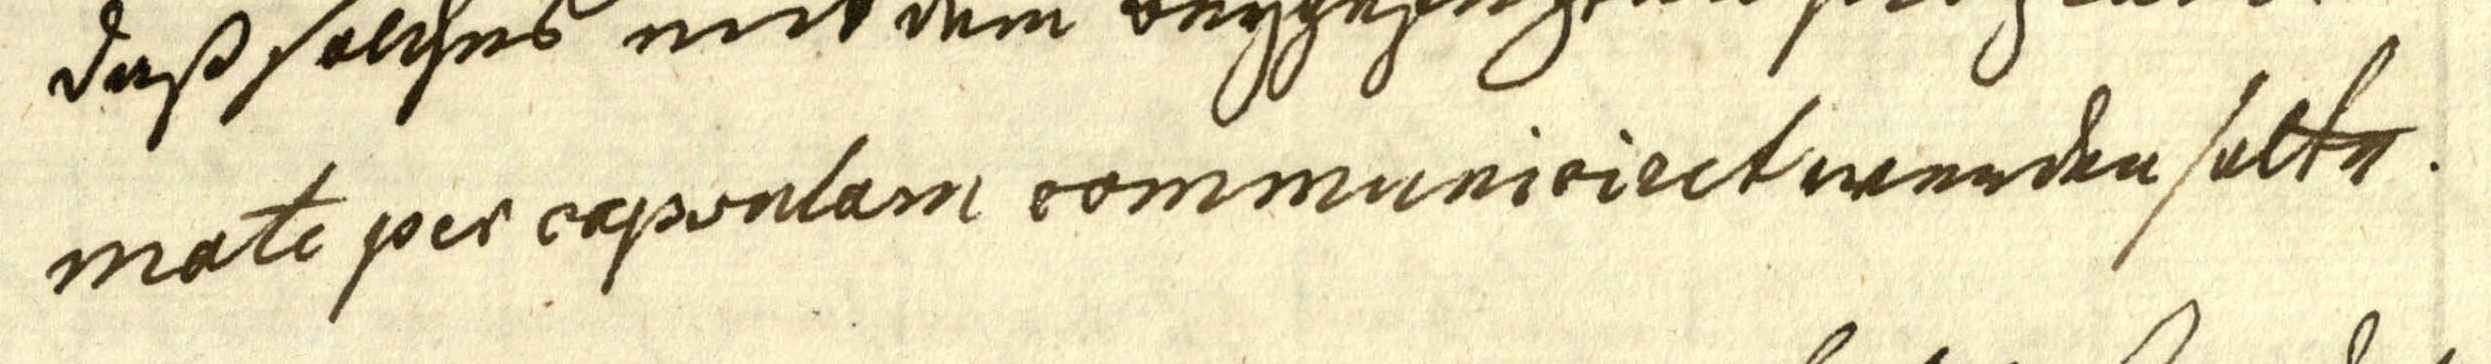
mate per capsulam communiciret werden solte.
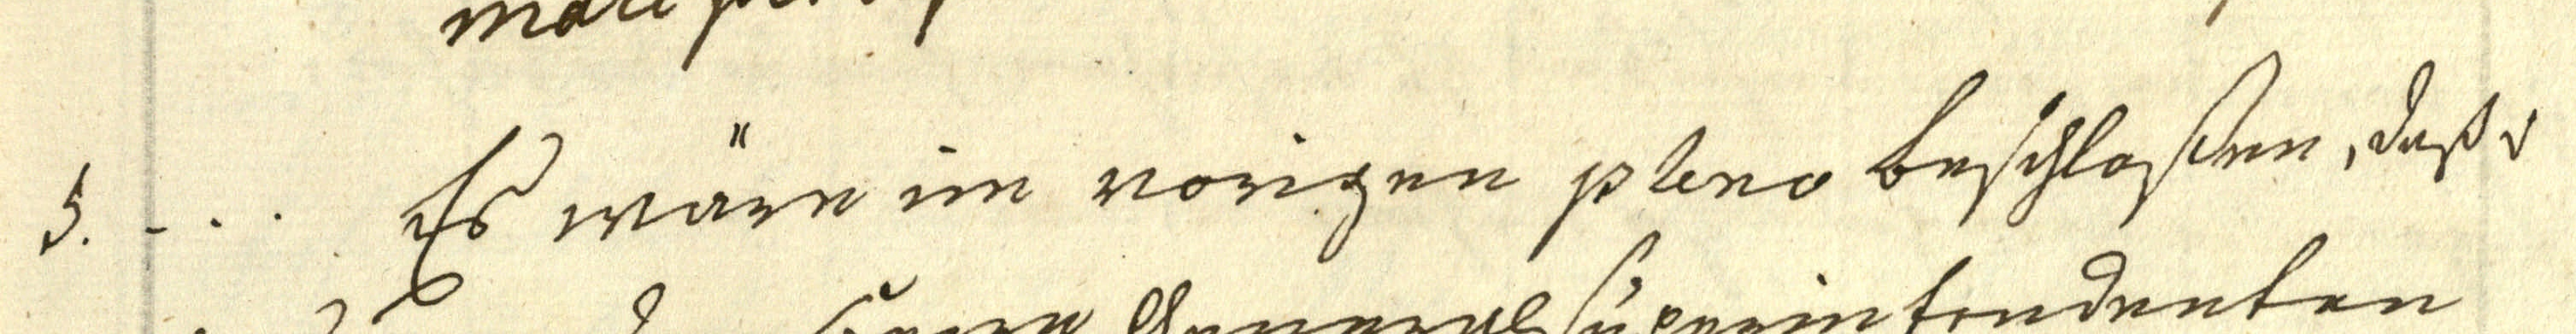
5. Es wäre im vorigen pleno beschloßen, daß
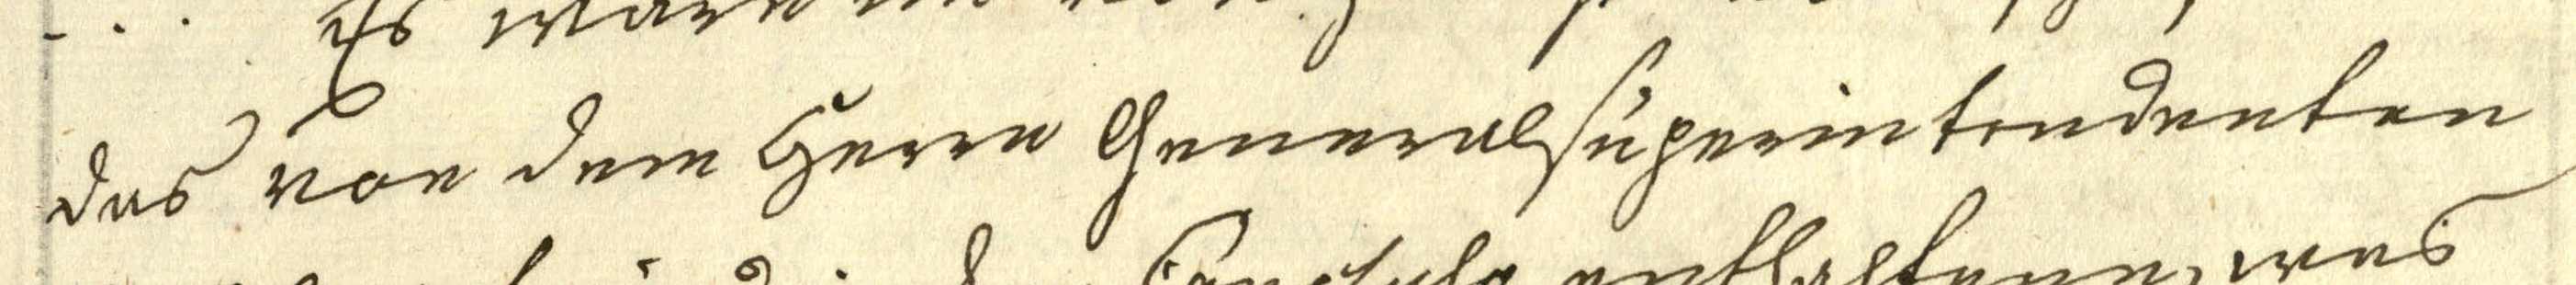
das von dem Herrn Generalsuperintendenten
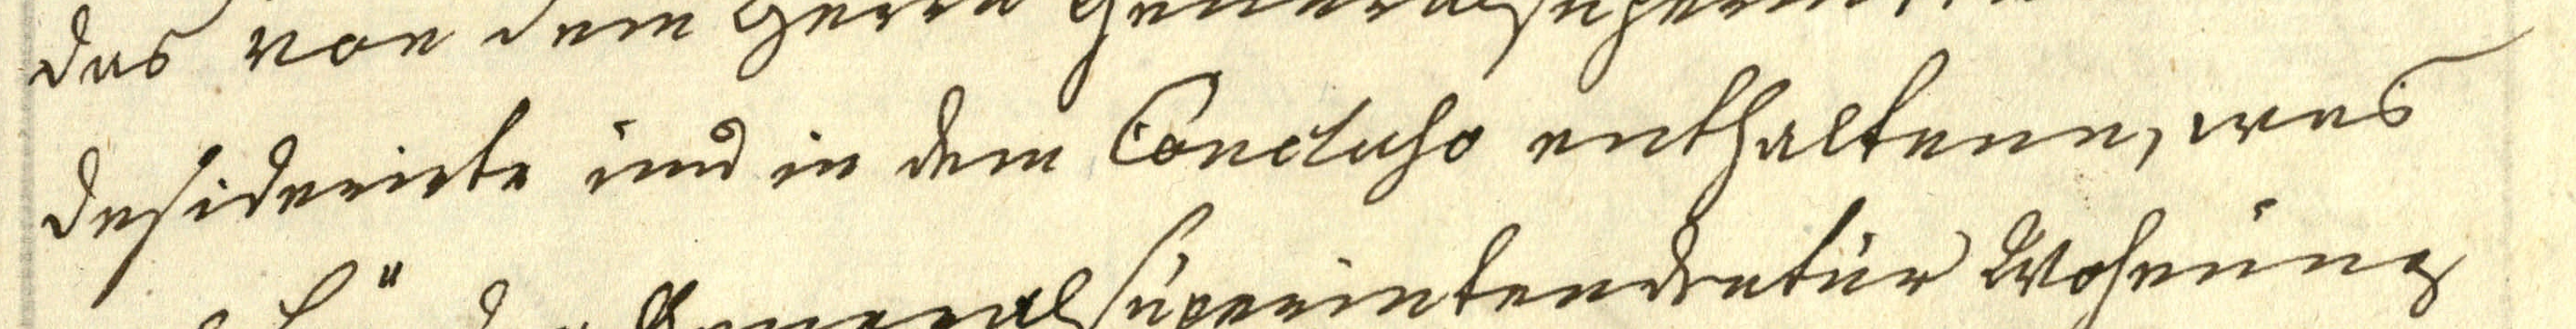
desiderirte und in dem Concluso enthaltene, was
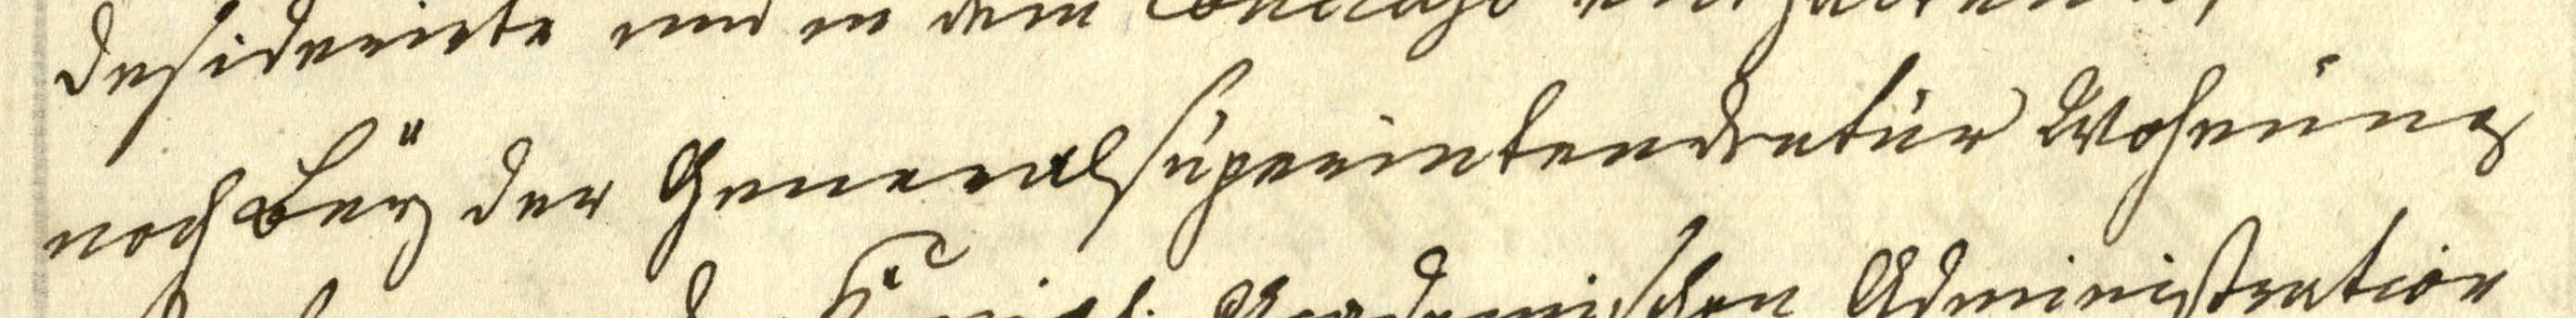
noch beÿ der Generalsuperintendenten Wohnung
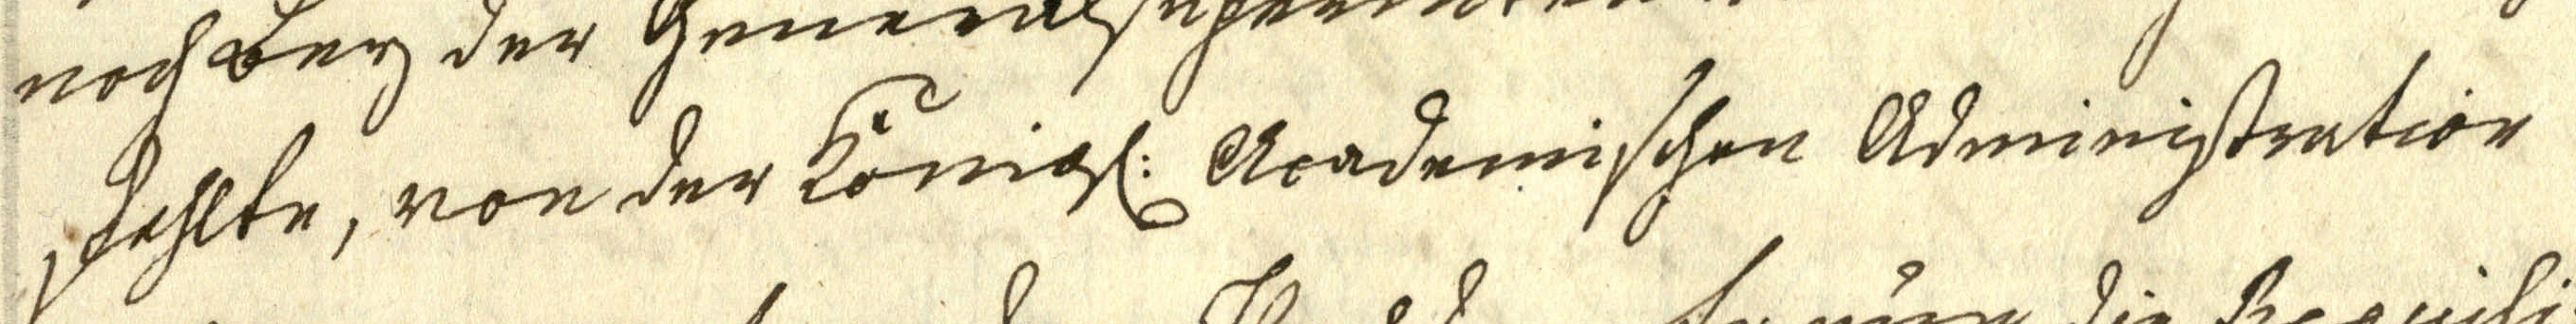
fehlte, von der Königl. Academischen Administration
